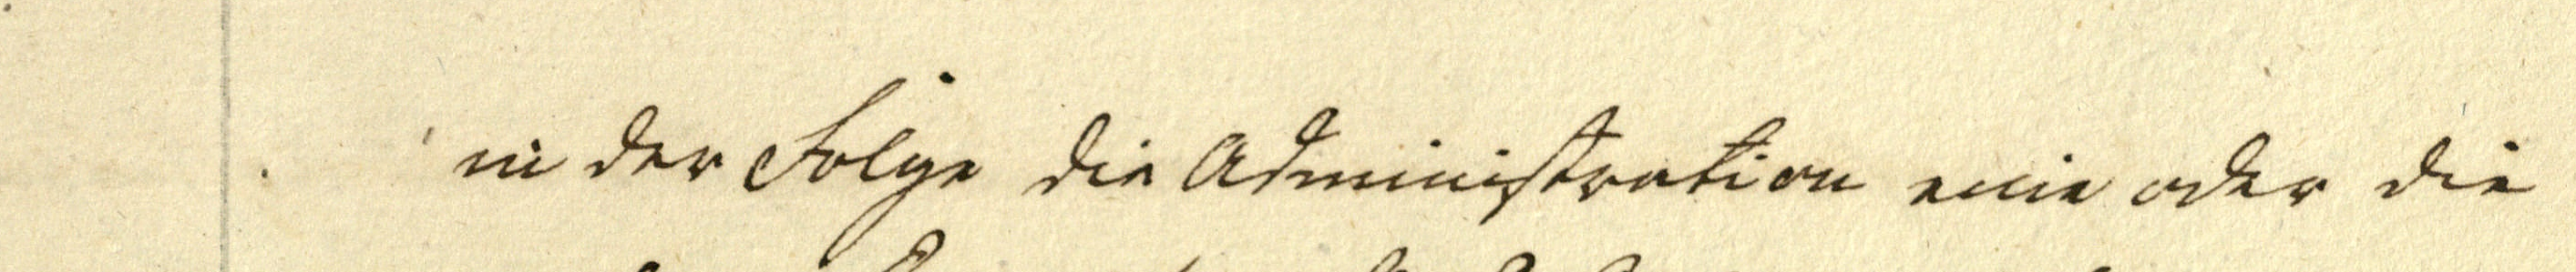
in der Folge die Administration eine oder die
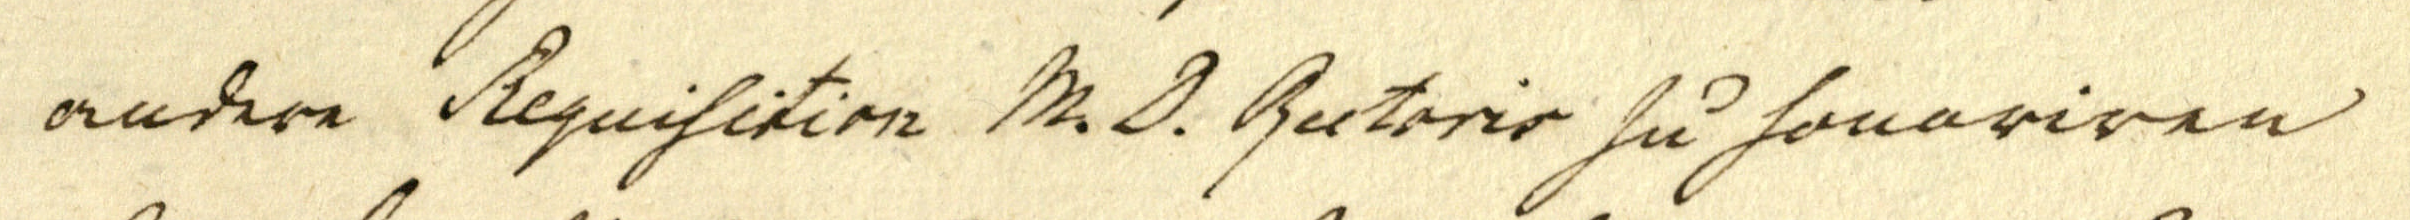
andere Requisition M. D. Rectoris zu honoriren
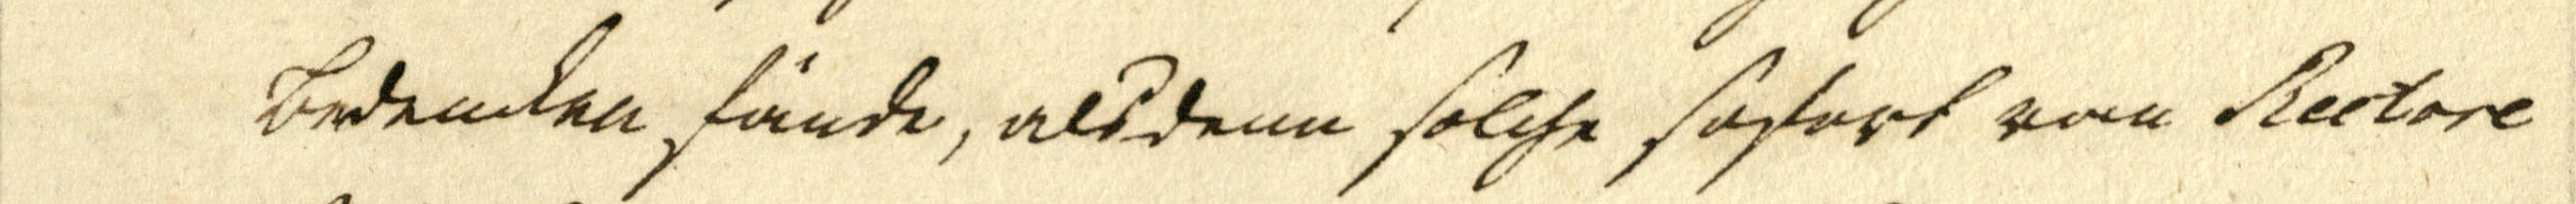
Bedencken fände, als denn solche sofort vom Rectore
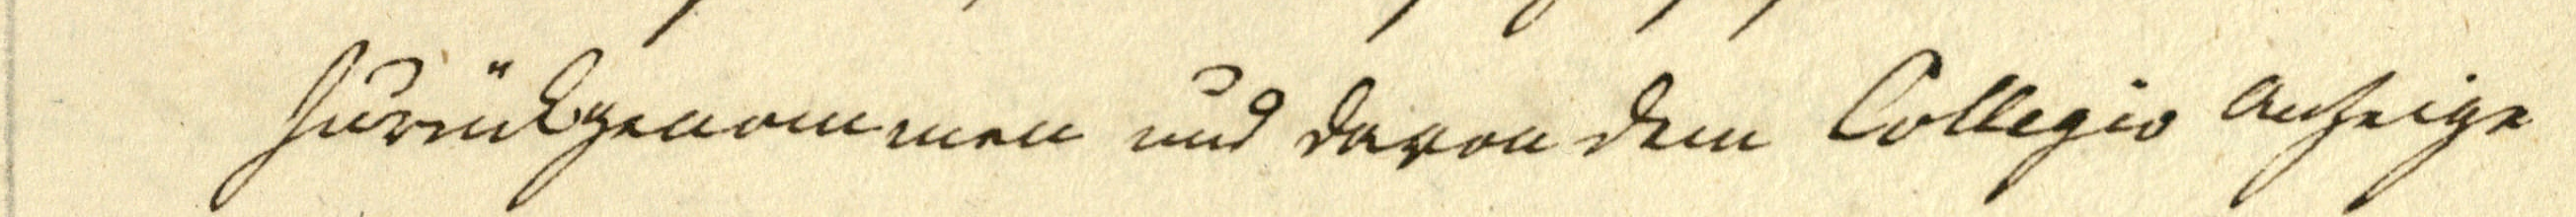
zurückgenommen und davon dem Collegio Anzeige
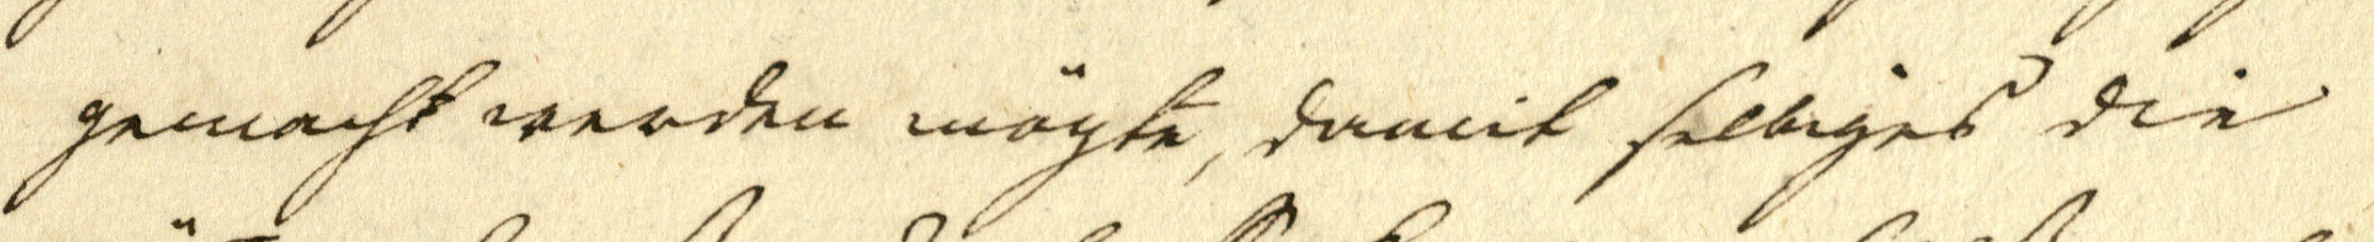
gemacht werden mögte, damit selbiges die
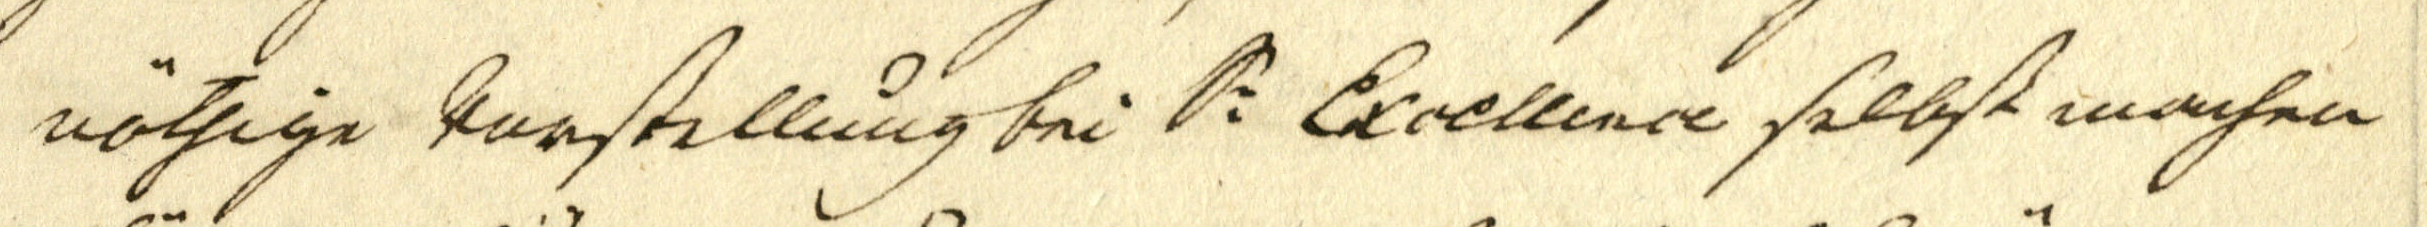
nöthige Vorstellung bei Sr. Excellence selbst machen
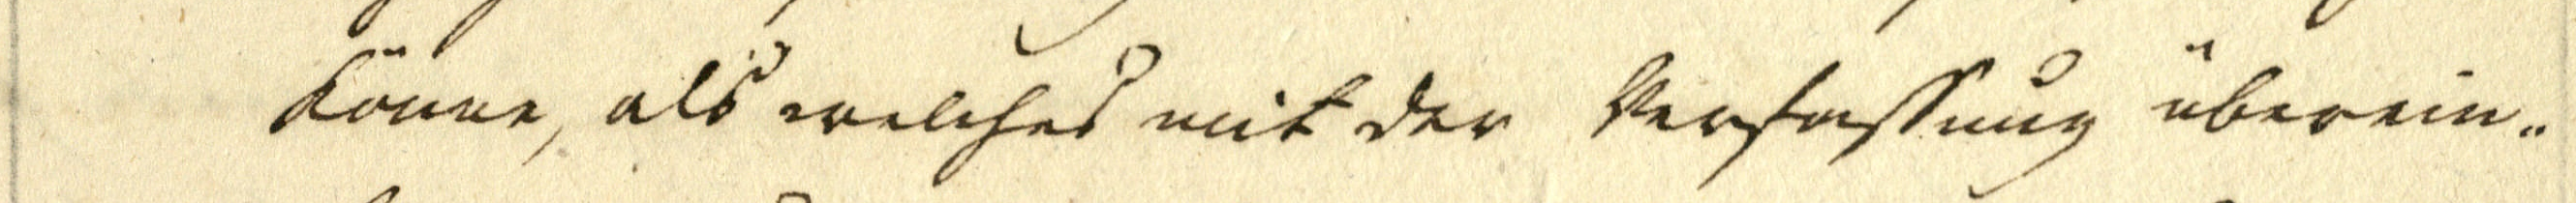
könne, als welches mit der Verfassung überein¬
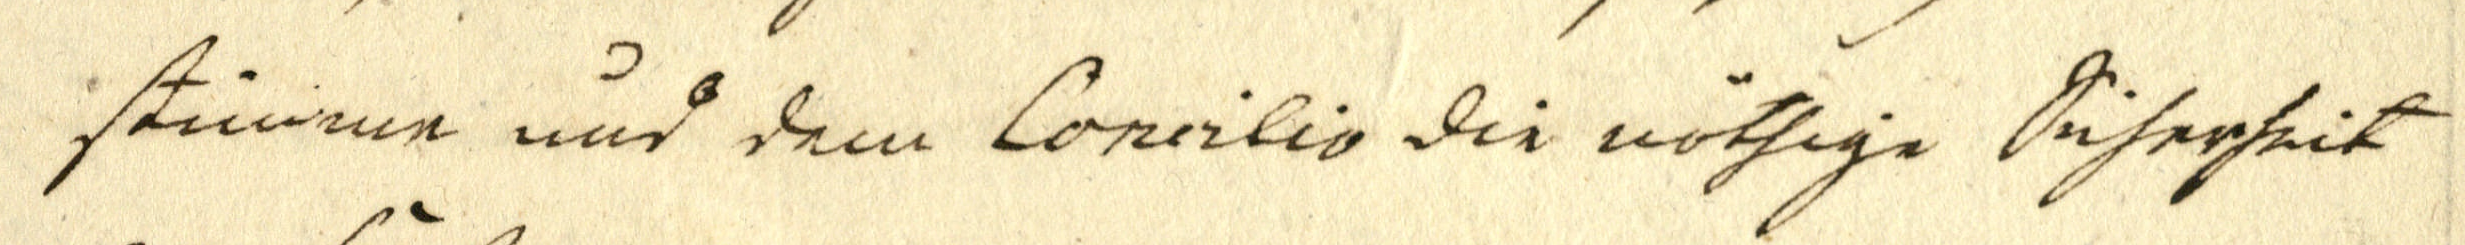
stimme und dem Concilio die nöthige Sicherheit
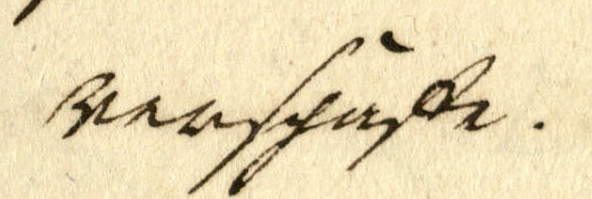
verschafe.
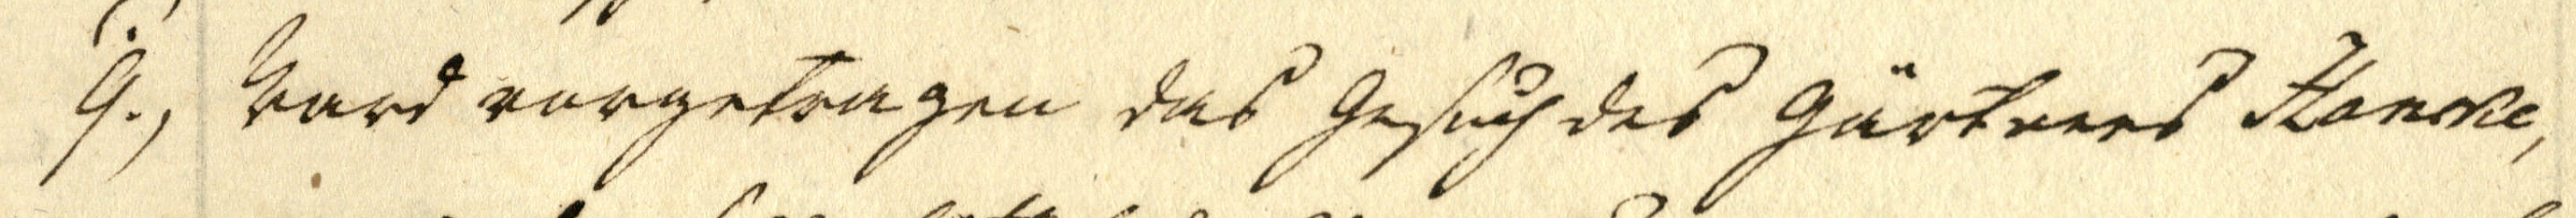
9., Ward vorgetragen das Gesuch des Gärtners Hancke
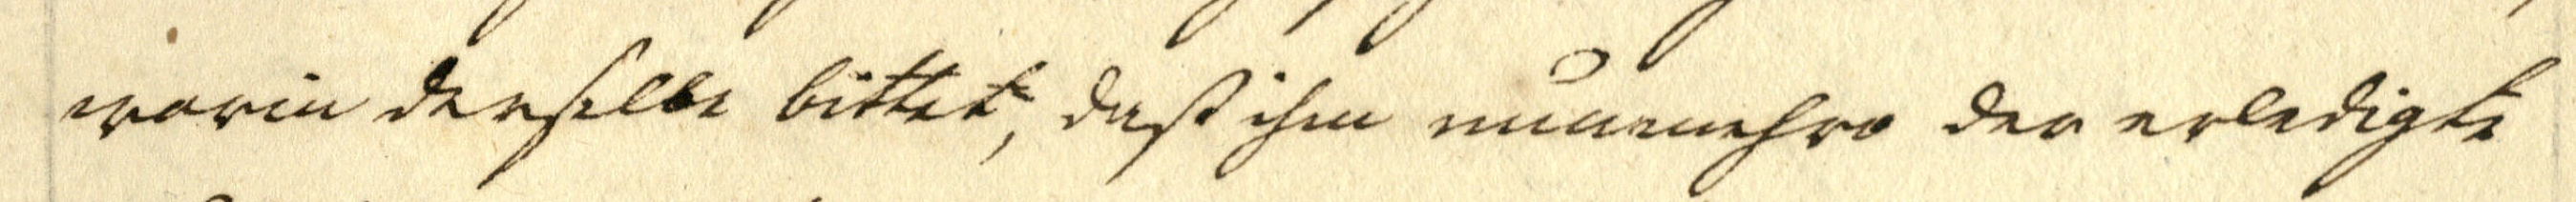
worin derselbe bittet, daß ihm nunmehro der erledigte
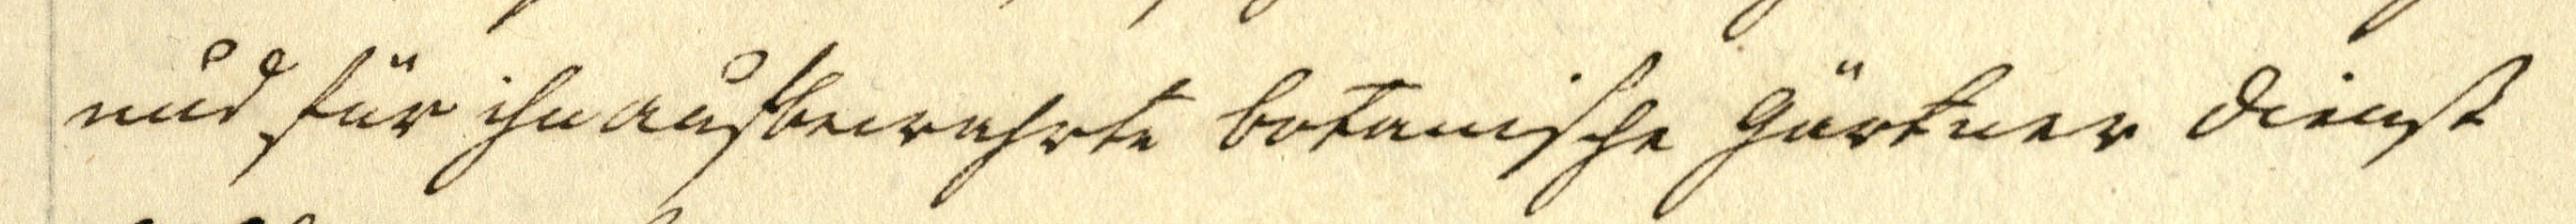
und für ihn aufbewahrte botanische Gärtner Dienst
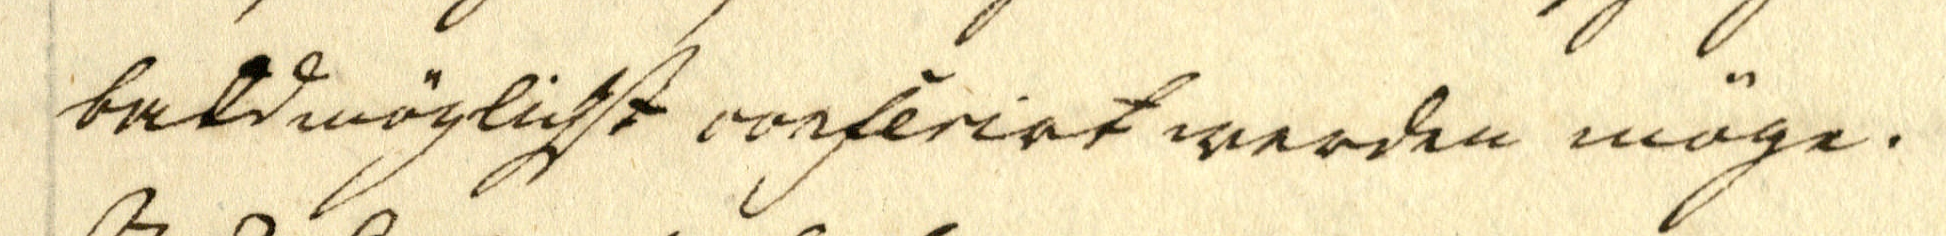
baldmöglichst conferirt werden möge.
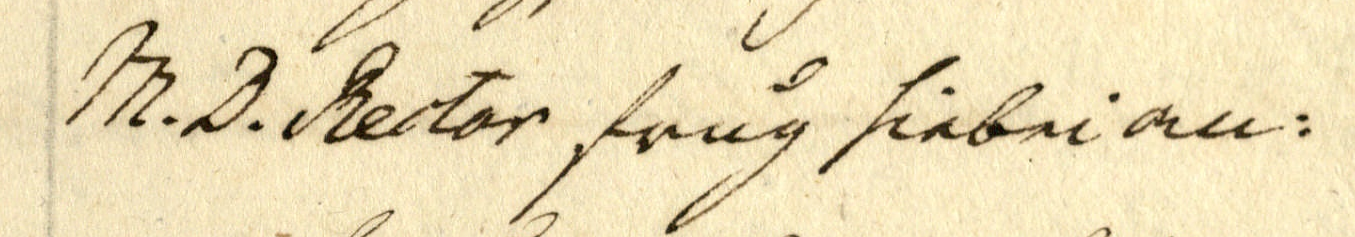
M. D. Rector frug hiebei an:
